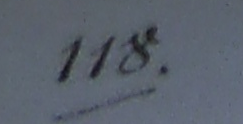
118.
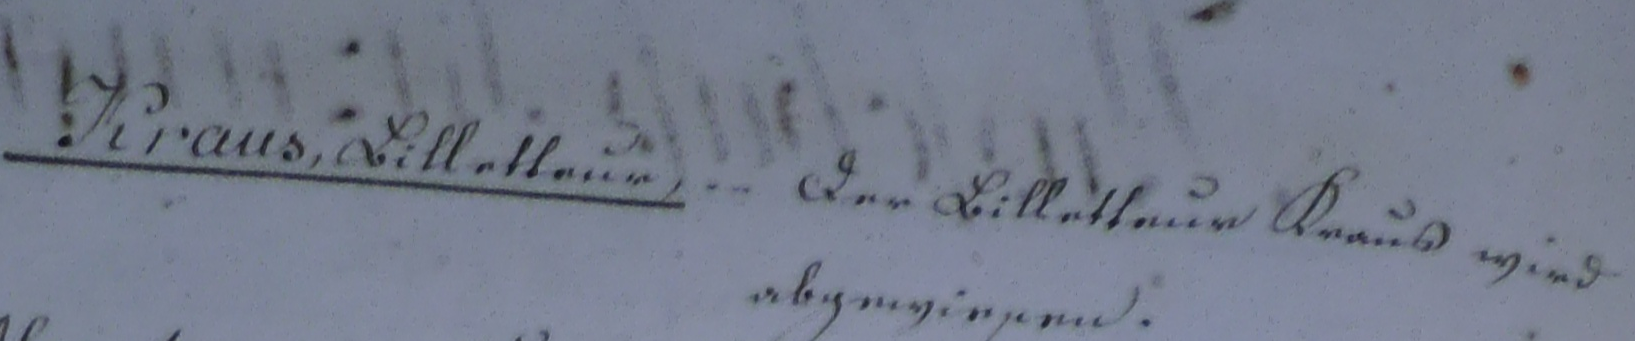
Kraus, Billetteur, . .. Der Billetteur Kraus wird
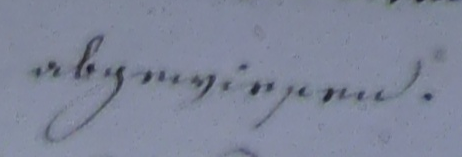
abgewiesen.
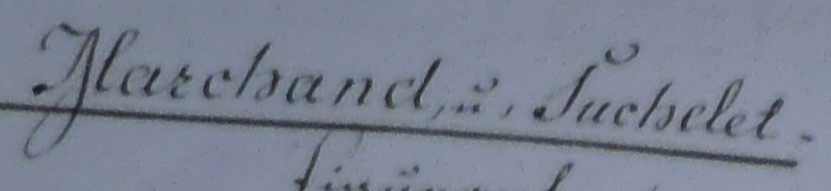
Marchand, u, Suchelet .
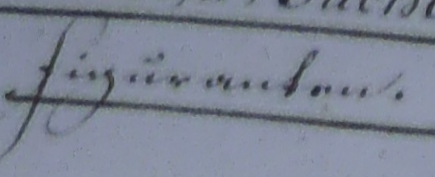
Figuranten.
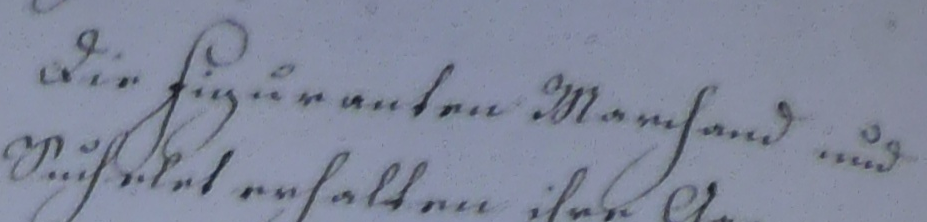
Die Figuranten Marchand und
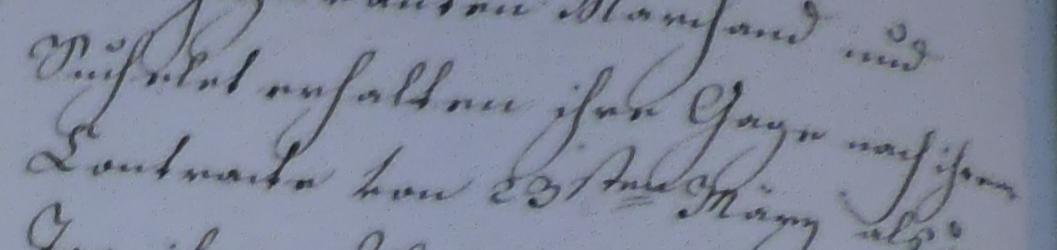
Suchelet erhalten ihre Gage nach ihrem
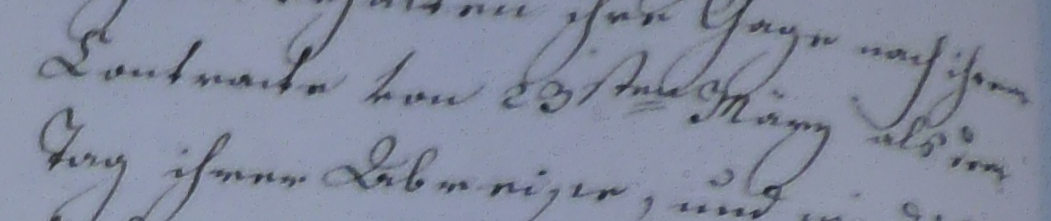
Contracte von 23ste͇n März als dem
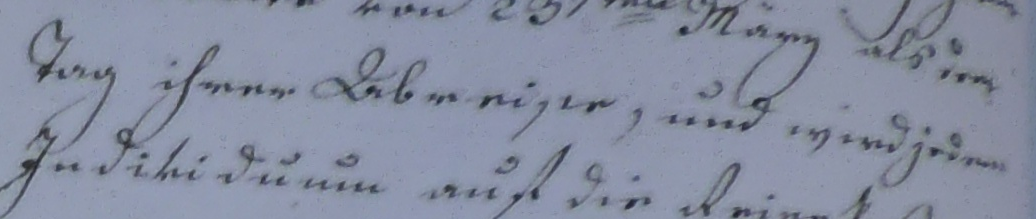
Tag ihrer Abreise, und wird jedem
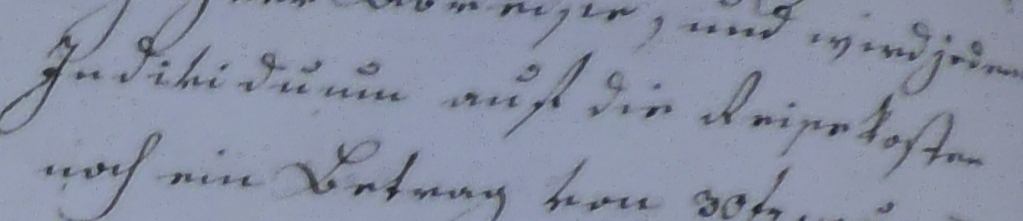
Individiuum auf die Reisekosten
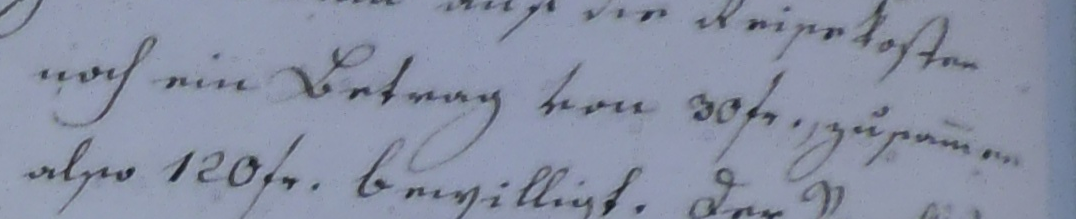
noch ein Betrag von 30fr., zusam̅en
